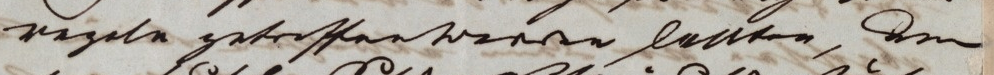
regeln getroffen werden sollten, um
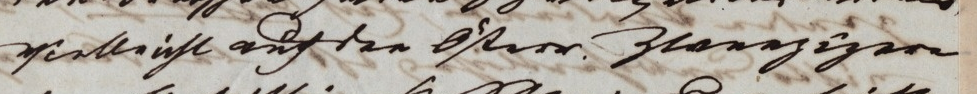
vielleicht auch den Österr. Zwanzigern
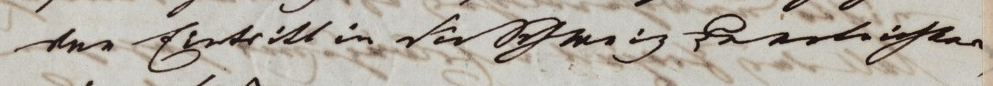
den Eintritt in die Schweiz zu erleichtern
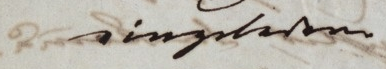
eingeladen.
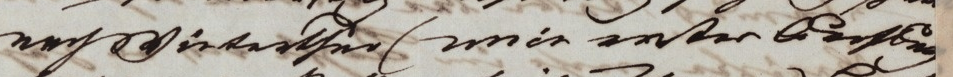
nach Winterthur (mein erster Ausflug
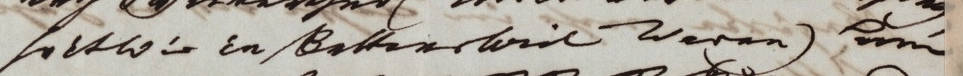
seit wir in Baltensweil waren) um
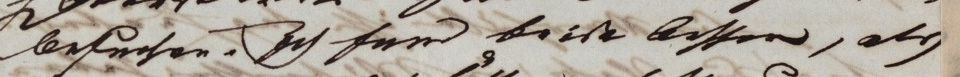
besuchen. Ich fand beide besser, als
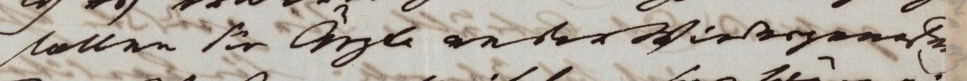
sollen die Ärzte an der Wiedergenesung
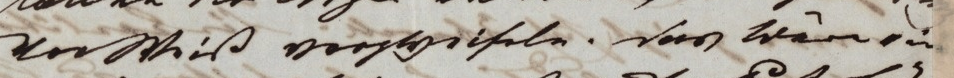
von Weiß verzweifeln. Das wäre ein
